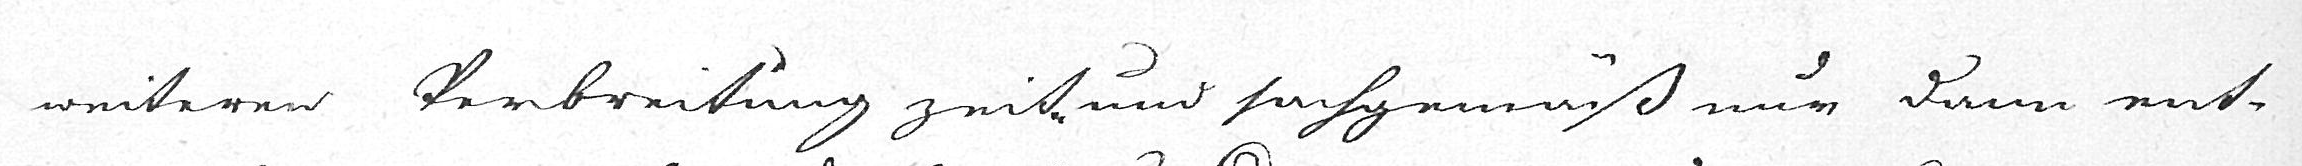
weiteren Verbreitung zeit- und sachgemäß nur dann ent-
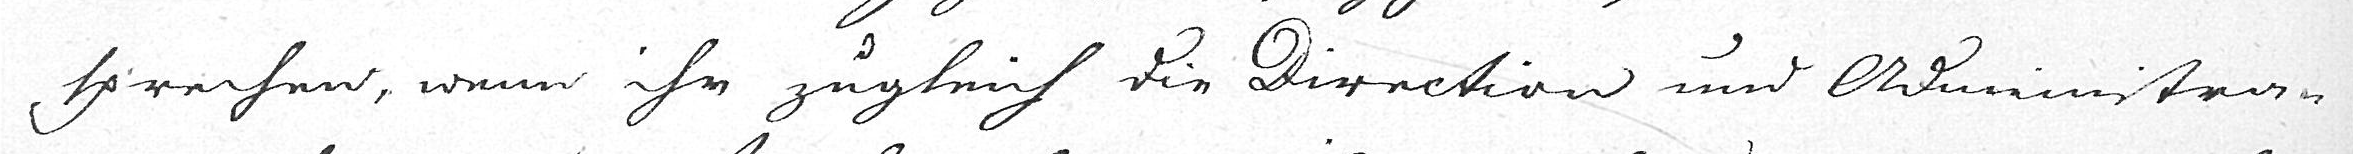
sprechen, wenn ihr zugleich die Direction und Administra-
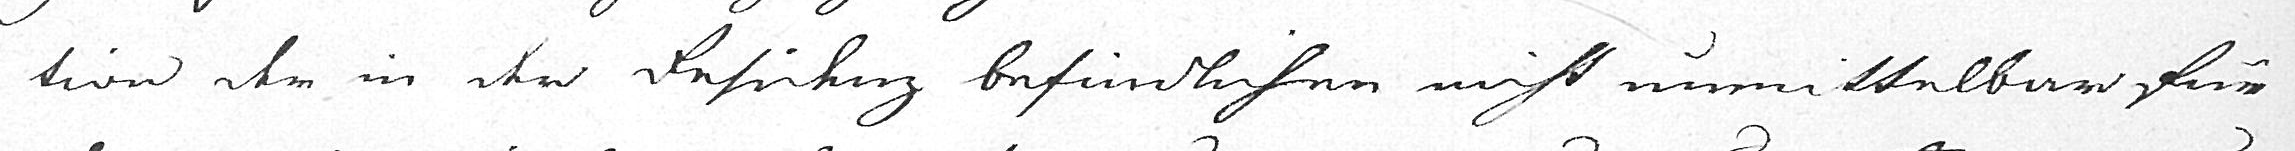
tion der in der Residenz befindlichen nicht unmittelbar für
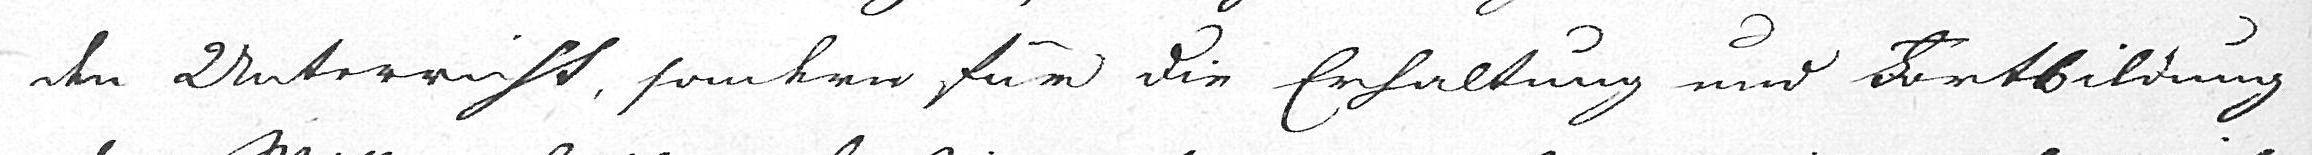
den Unterrichte, sondern für die Erhaltung und Förtbildung
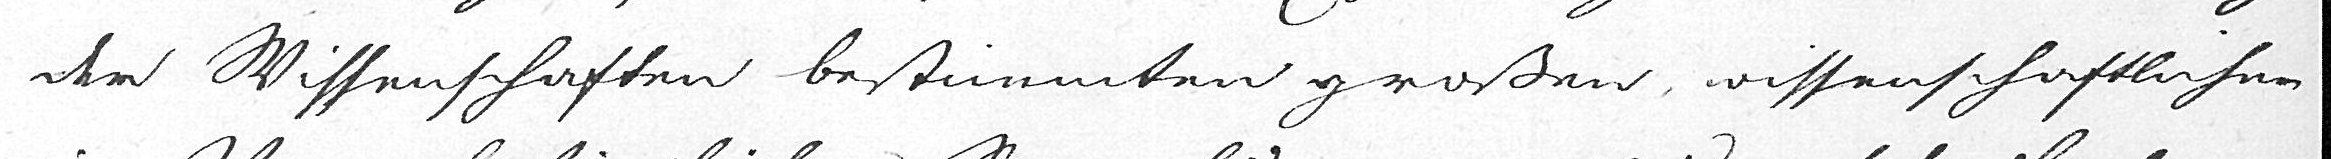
der Wissenschaften bestimmten großen, wissenschaftlichen
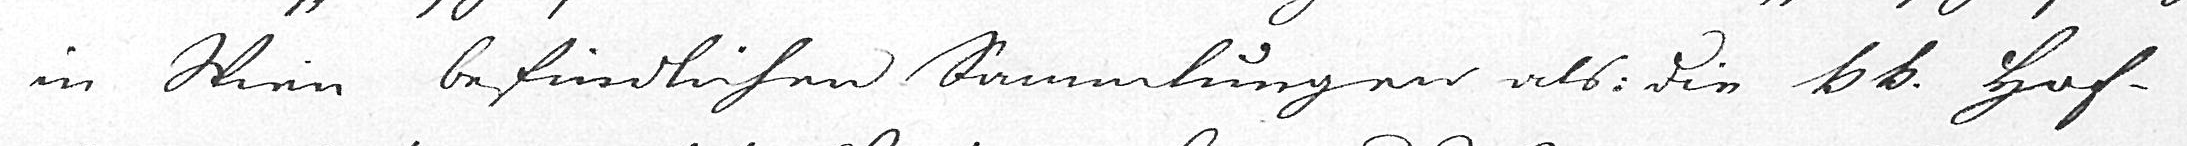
in Wien befindlichen Sammlungen als: die kk. Hof-
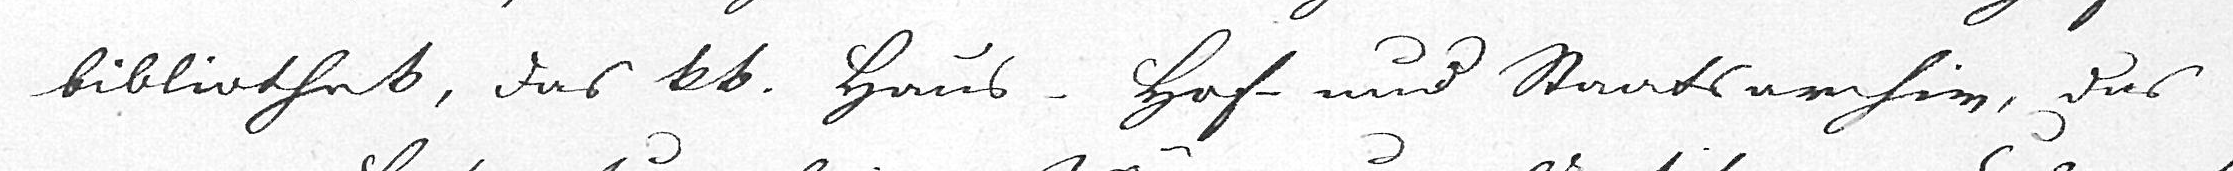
bibliothek, das kk. Haus- Hof- und Saatsarchiv, das
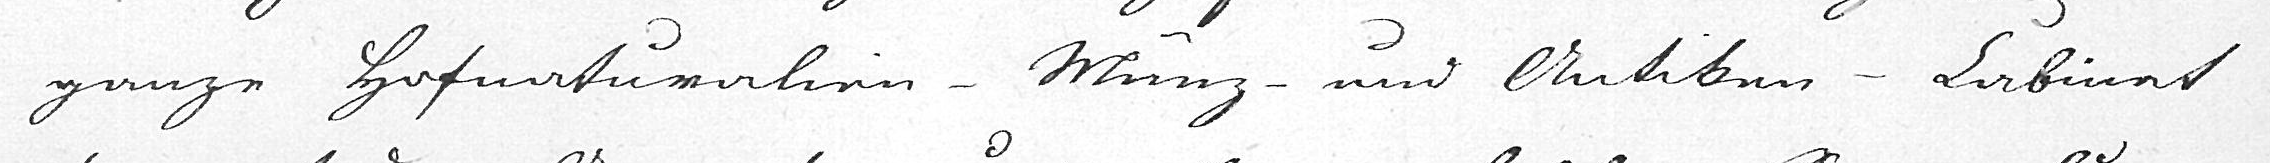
ganze Hofnaturalien- Münz- und Antiken-Cabinet
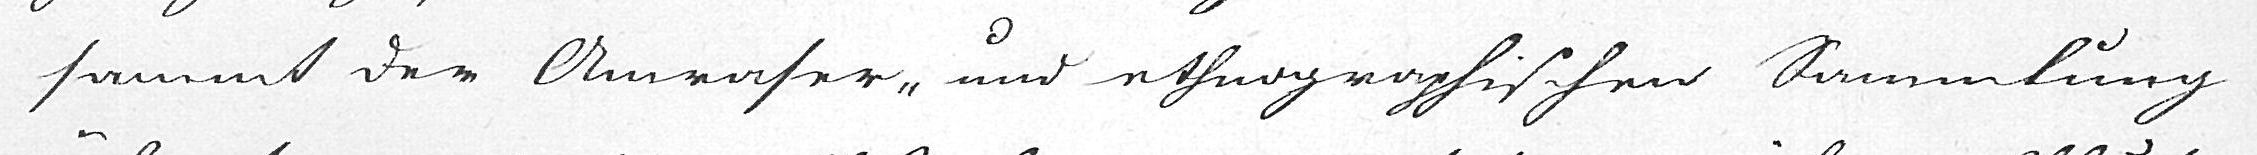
sammt der Amraser- und ethnographischen Sammlung
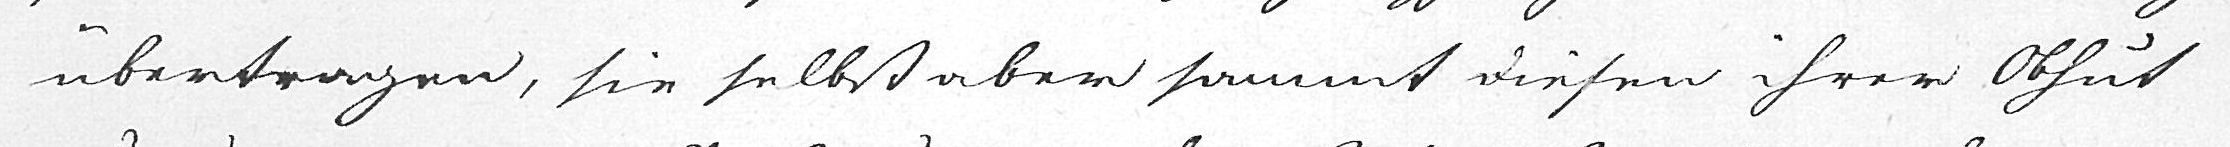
übertragen, sie selbst aber sammt diesen ihrer Obhut
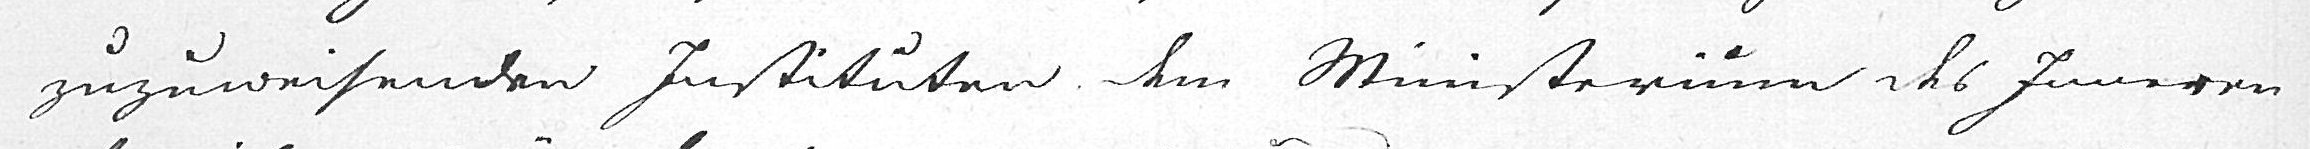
zuzuweisenden Instituten dem Ministerium des Inneren
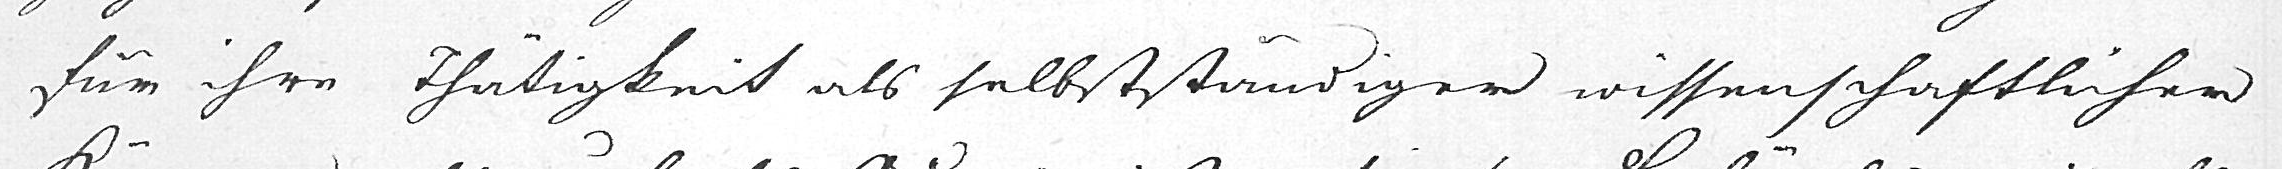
für ihre Thätigkeit als selbstständiger wissenschaftlicher
